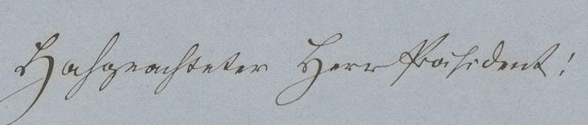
Hochgeachteter Herr Präsident!
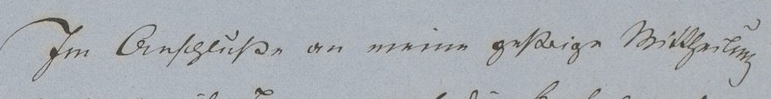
Im Anschluße an meine gestrige Mittheilung
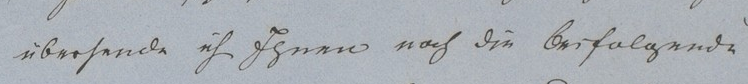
übersende ich Ihnen noch die beifolgende
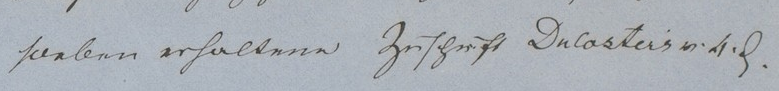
soeben erhaltene Zuschrift DuCoster's v. 4. d.
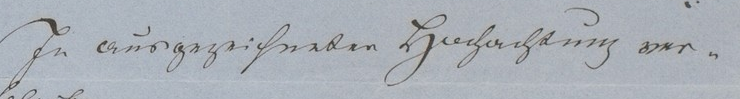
In ausgezeichneter Hochachtung ver-
